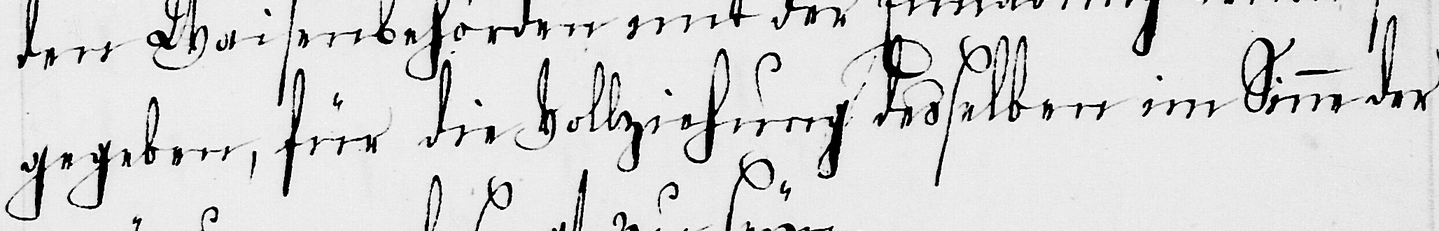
gegeben, für die Vollziehung desselben im Sinne der
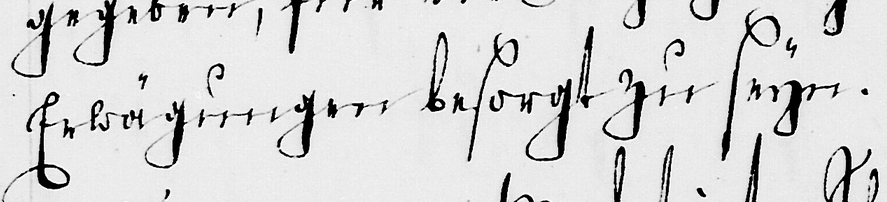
Erwägungen besorgt zu seyn.
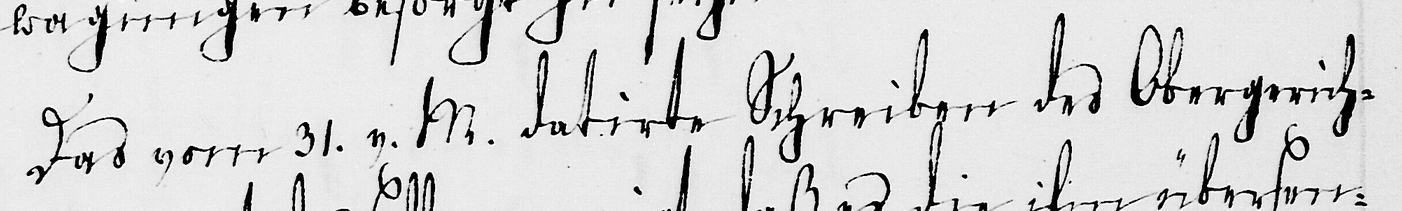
Das vom 31. v. M. datirte Schreiben des Obergerich¬
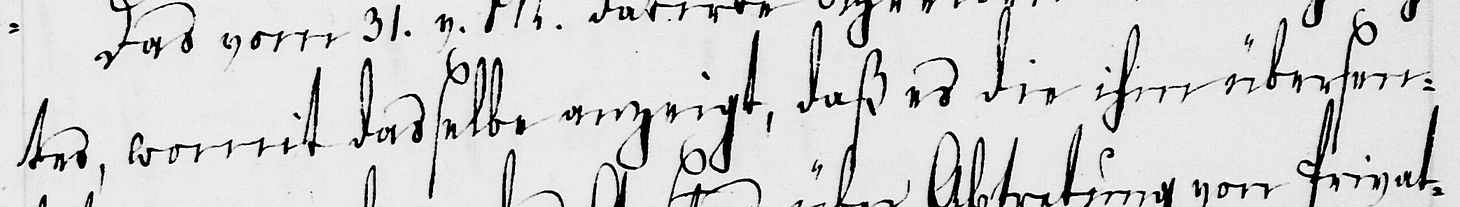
tes, womit dasselbe anzeigt, daß es die ihm übersen¬
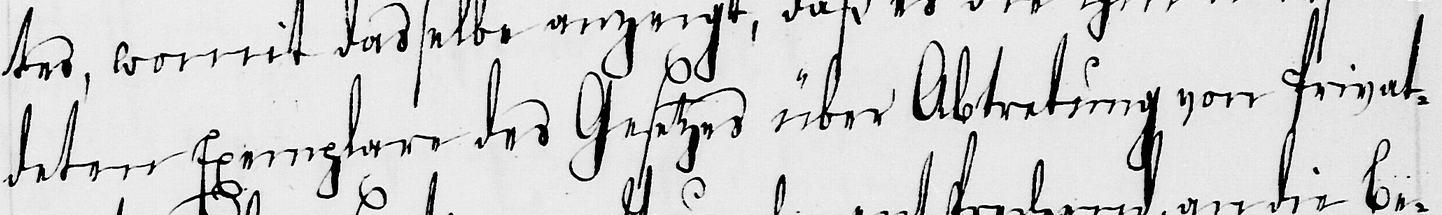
deten Exemplare des Gesetzes über Abtretung von Privat¬
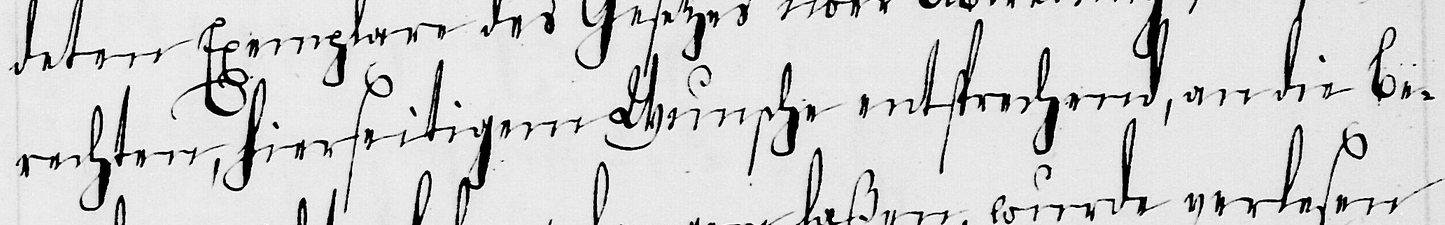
rechten, hierseitigem Wunsche entsprechend, an die Be¬
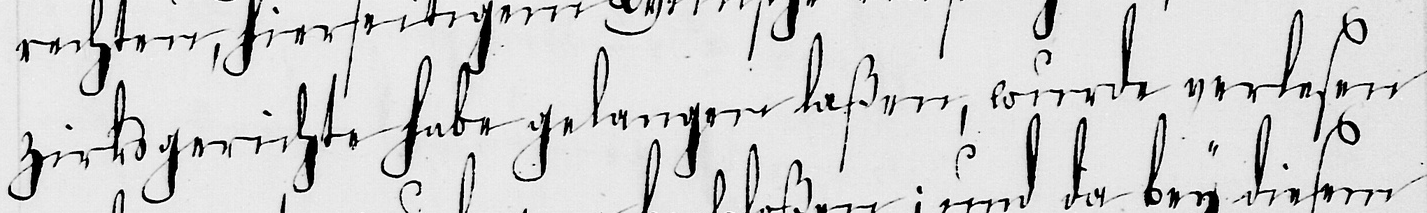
zirksgerichte habe gelangen laßen, wurde verlesen
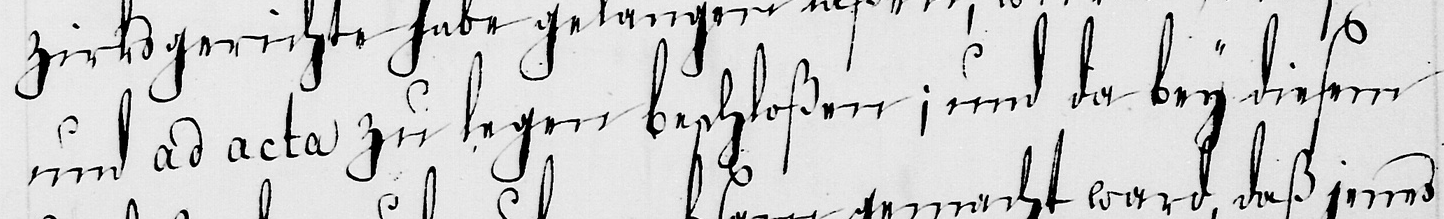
und ad acta zu legen beschloßen; und da bey diesem
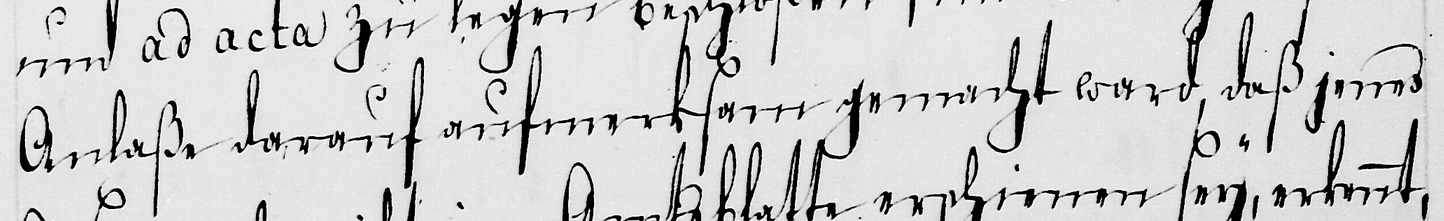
Anlaße darauf aufmerksam gemacht ward, daß jenes
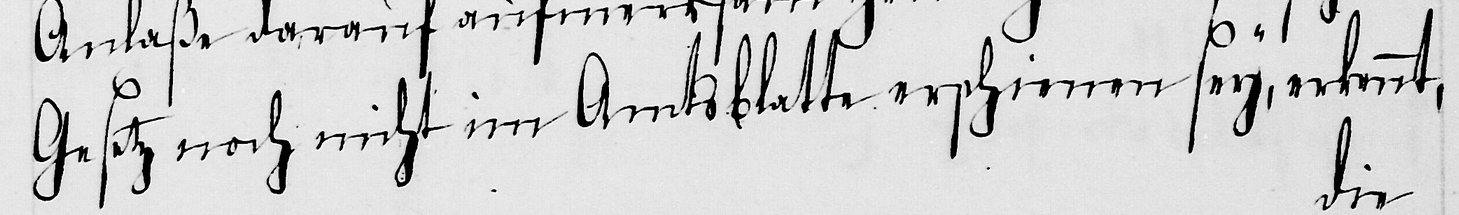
Gesetz noch nicht im Amtsblatte erschienen sey, erkennt,
